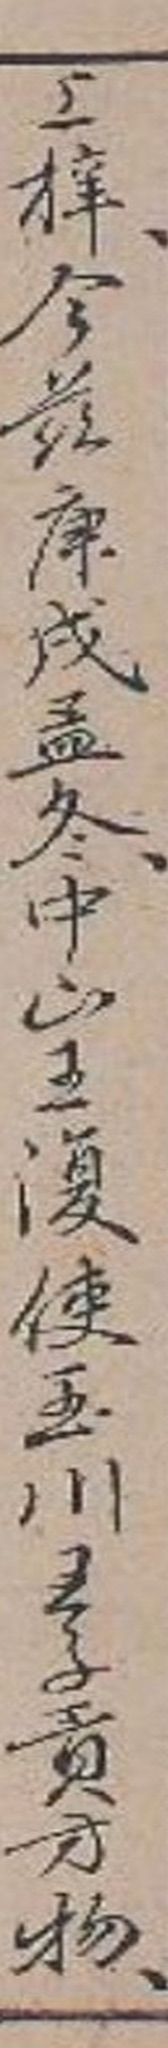上梓、今茲庚戌孟冬、中山王復使玉川王子貢方物、
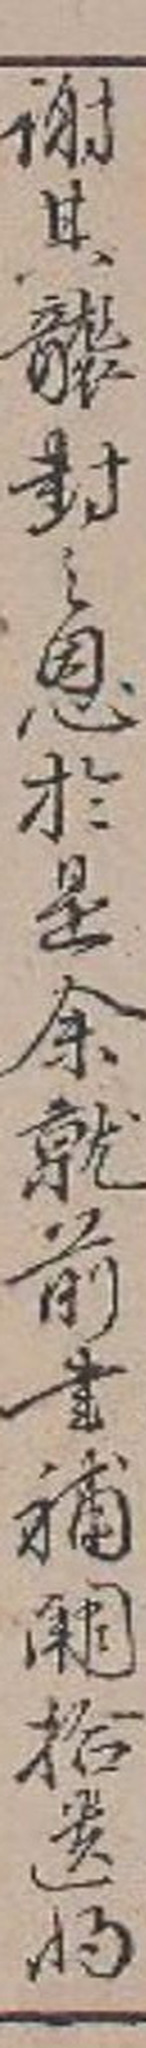謝其襲封之恩、於是余就前書、補闕拾遺、将
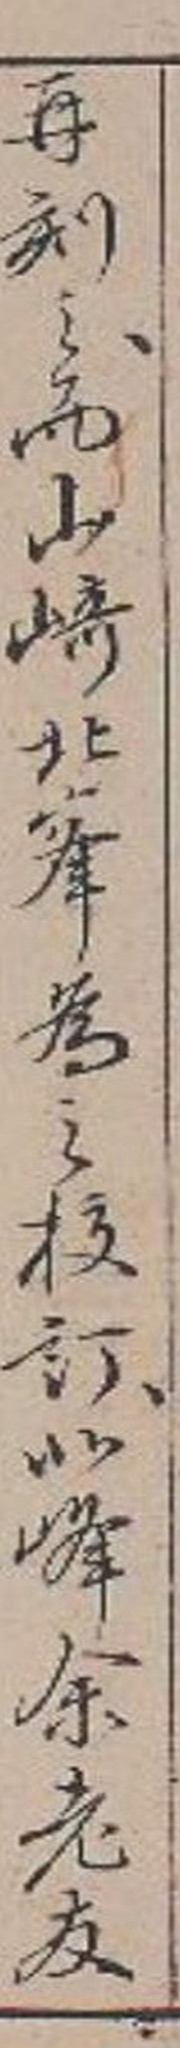再刻之、而山崎北峰為之校訂、北峰余老友
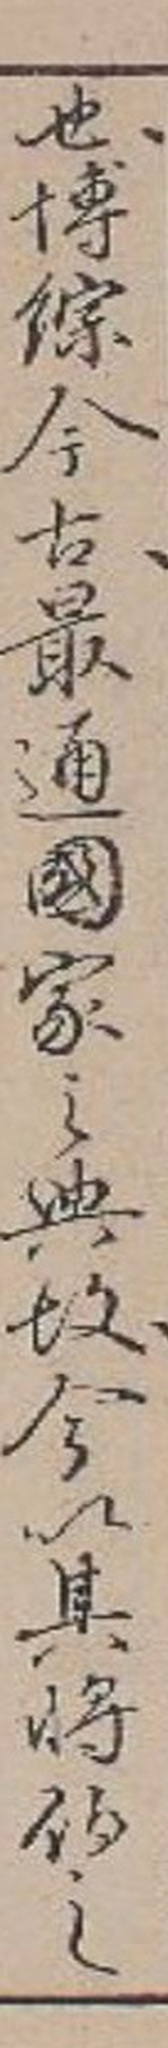也、博綜今古、最通国家之典故、今以其将伯之
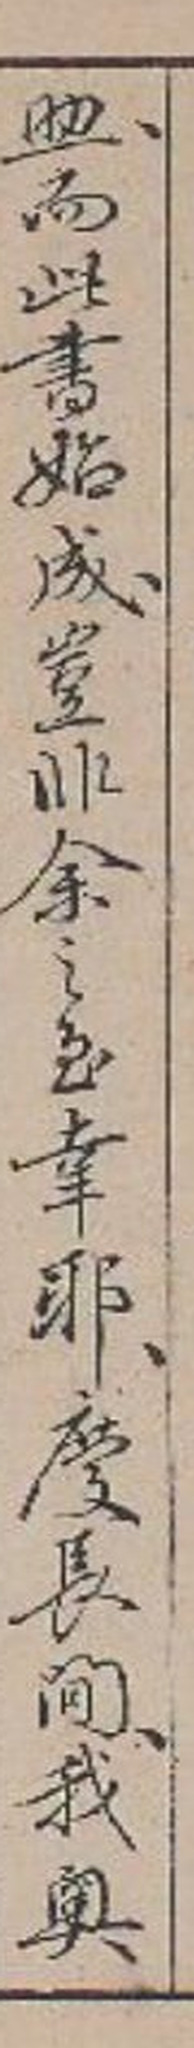助、而此書始成、豈非余之至幸耶、慶長間、我奥
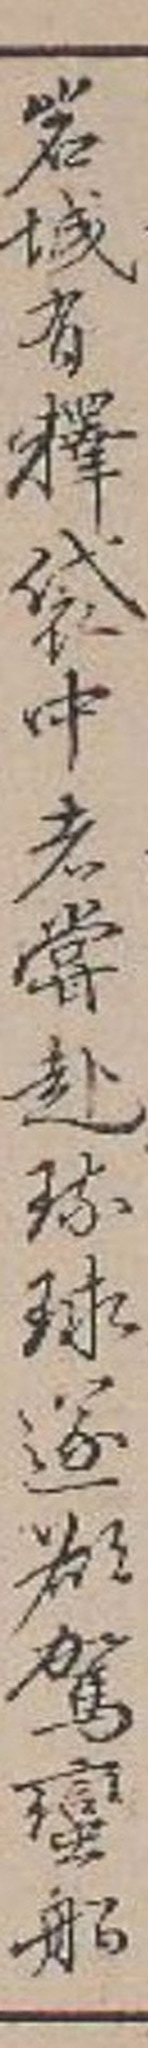岩城、有釈袋中者、嘗赴琉球、遂欲駕蛮船
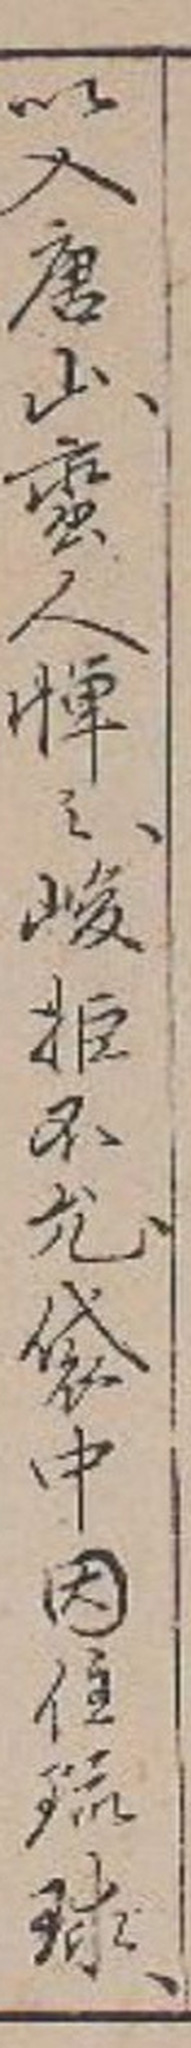以入唐山、蛮人憚之、峻拒不允、袋中因住琉球、
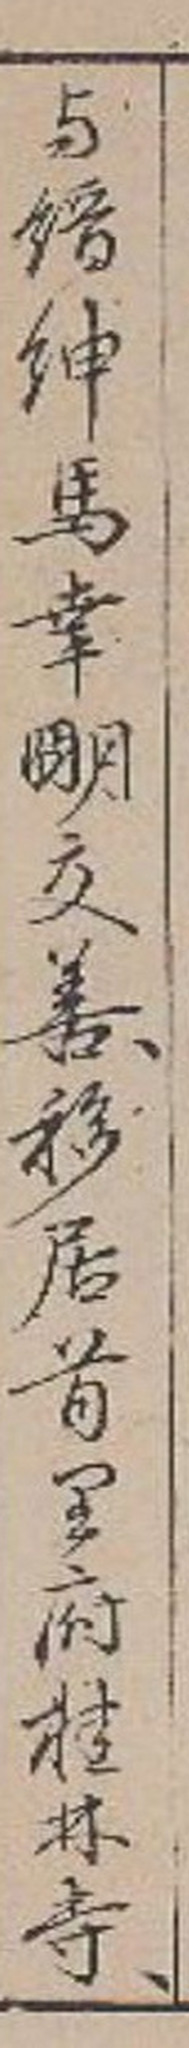与縉紳馬幸朙交善、移居首里府桂林寺、
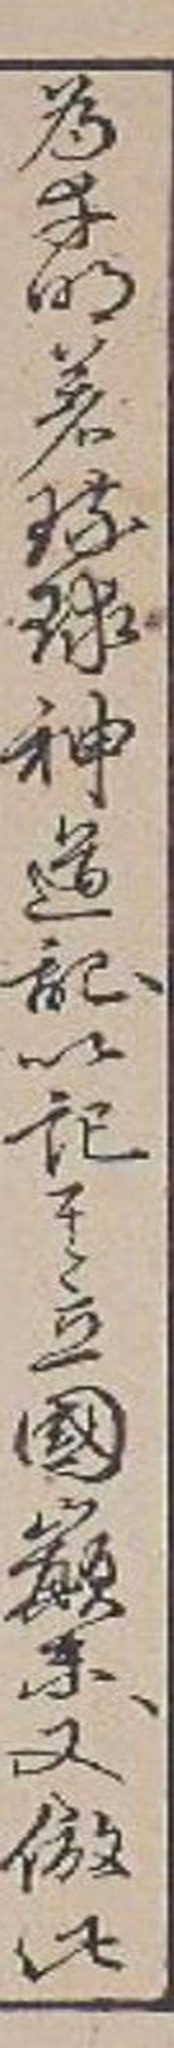為幸明著琉球神道記、以記其立国巔末、又倣此
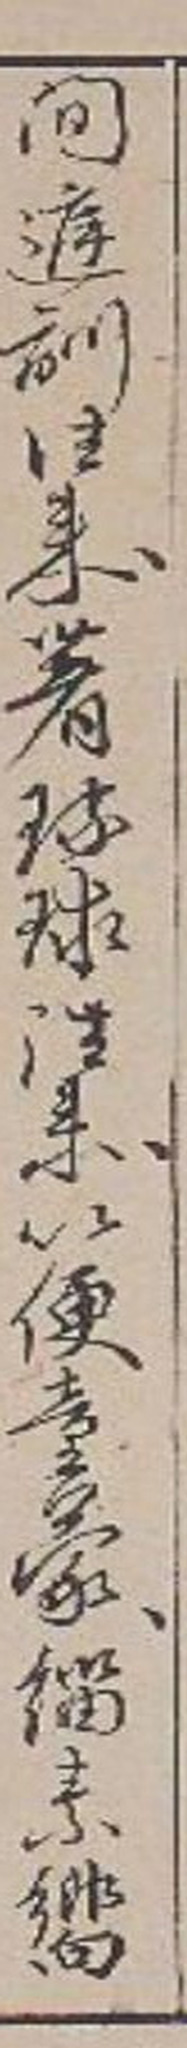間庭訓往来、著琉球往来、以便童蒙、緇素嚮
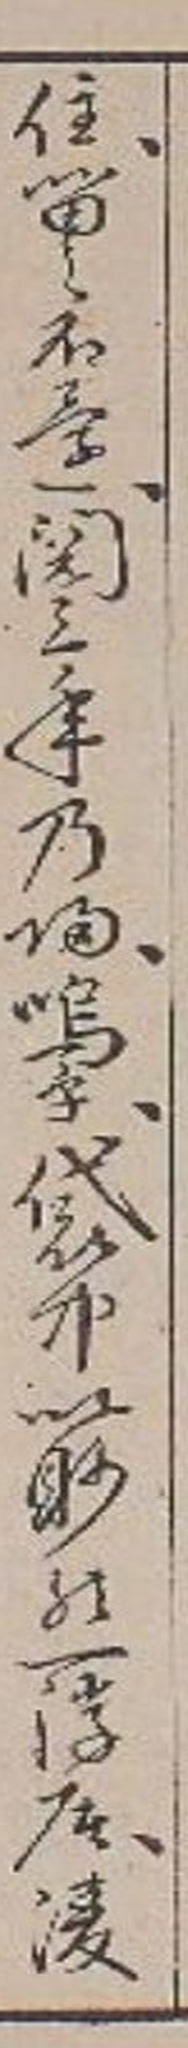往、留之不還、関三年乃帰、嗚乎、袋中以眇能一浮居、凌
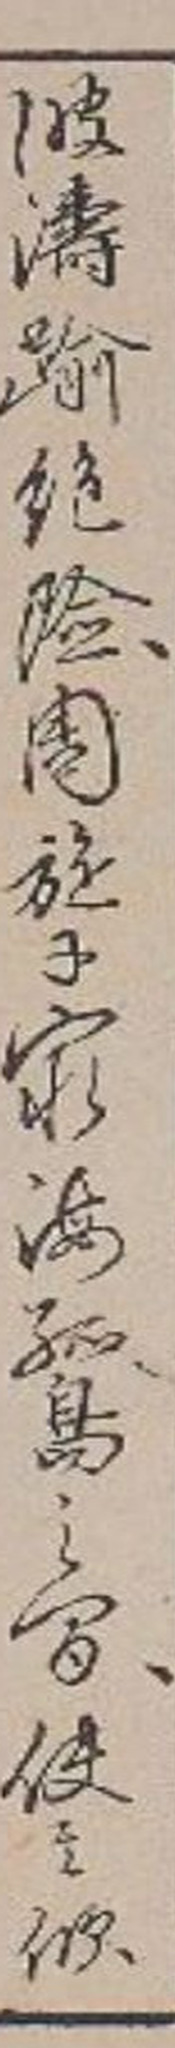波濤踰絶険、周旋于窮海孤島之間、使其欣
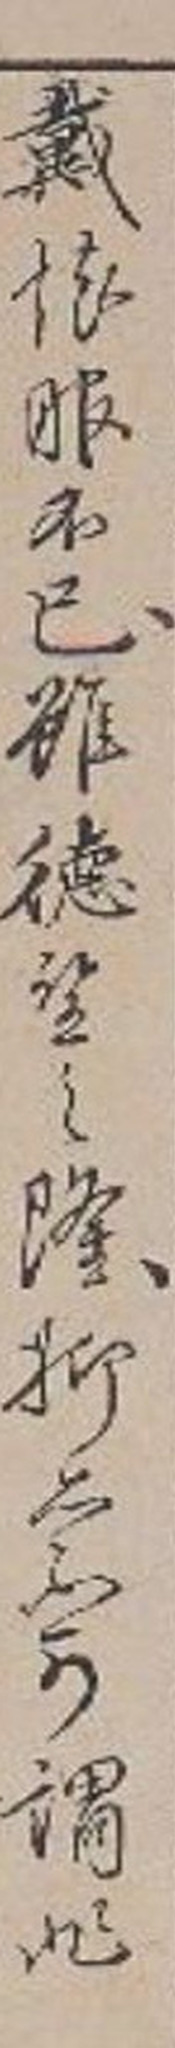戴依服不已、雖徳望之隆、抑亦不可謂非
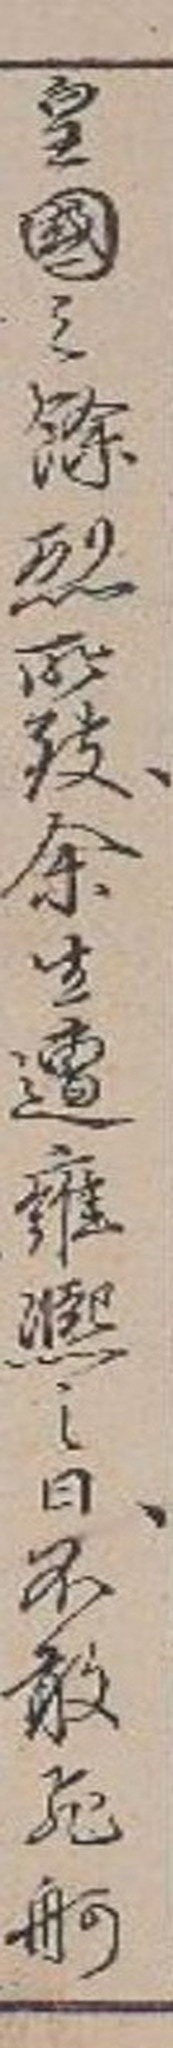皇国之余烈所致、余生遭雍煕之曰、不敢飛舸
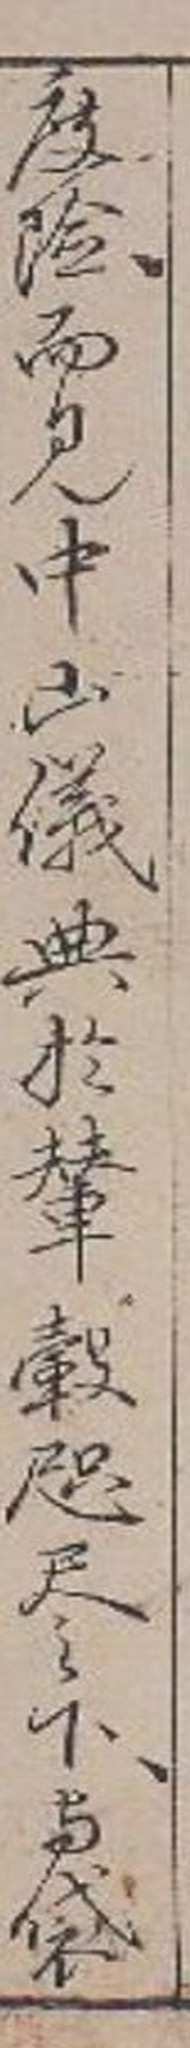度険、而見中山儀典於輦轂咫尺之下、与袋
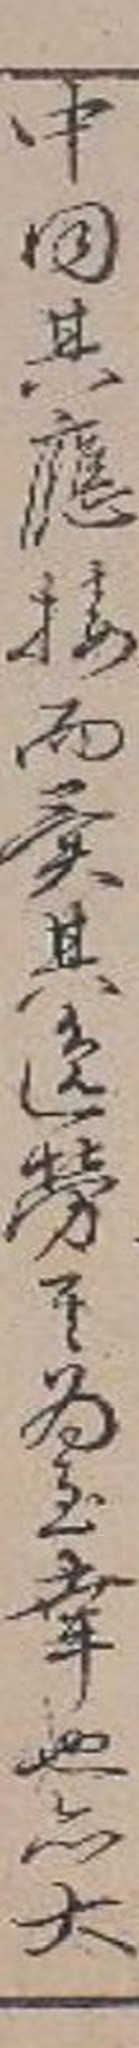中同其応接、而異其逸労、其為至幸也亦大
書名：琉球入貢紀略
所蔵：University of the Ryukyus Library
